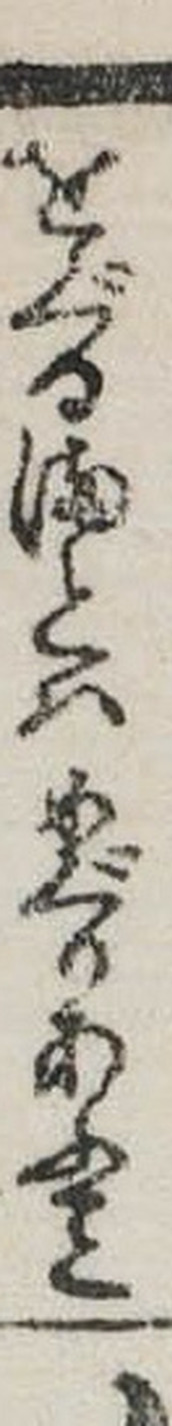をぐるまとはめぐりあふこと
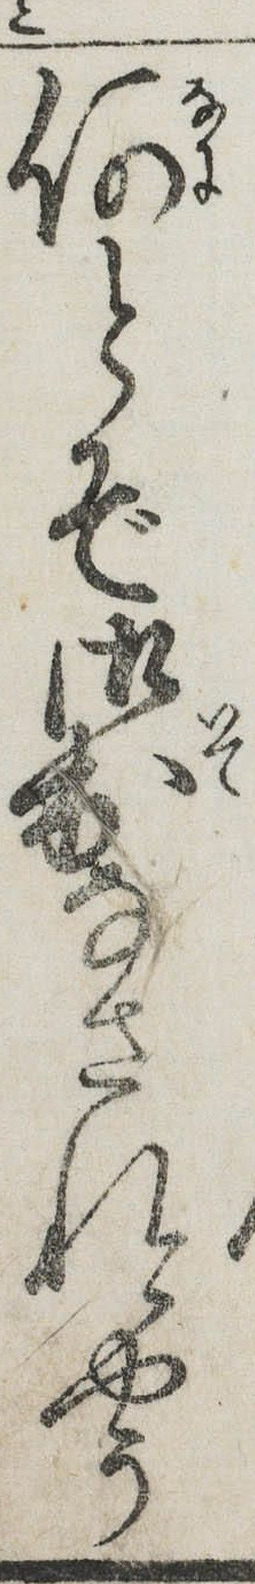何とぞ御出なされ候やう
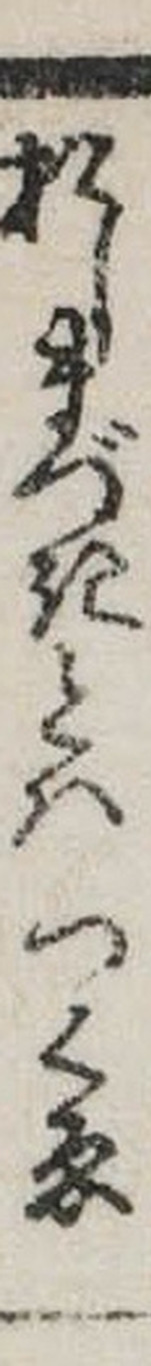おしまづきとはつくゑ
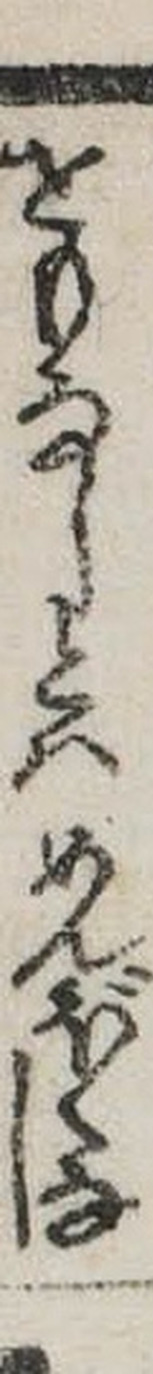をもなしとはめんぼくなし
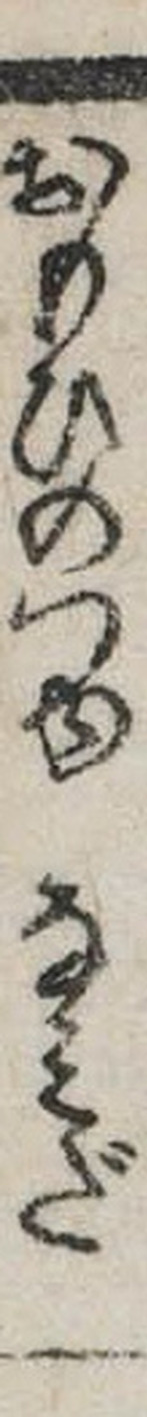おもひのつゆなみだ

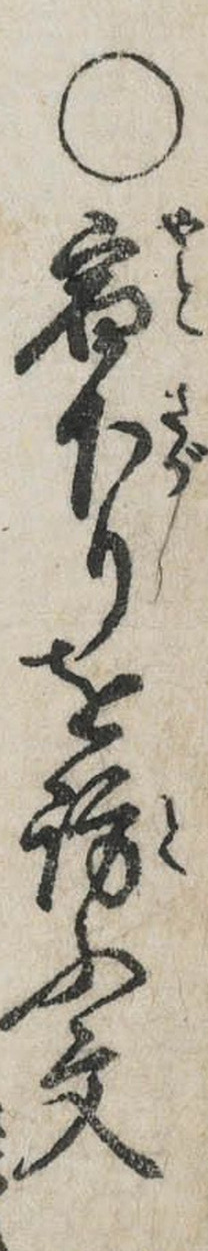○宿下りを訪ふ文
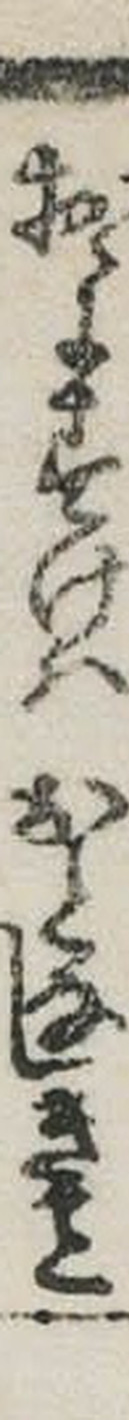おゝよすけはおとなしきこと
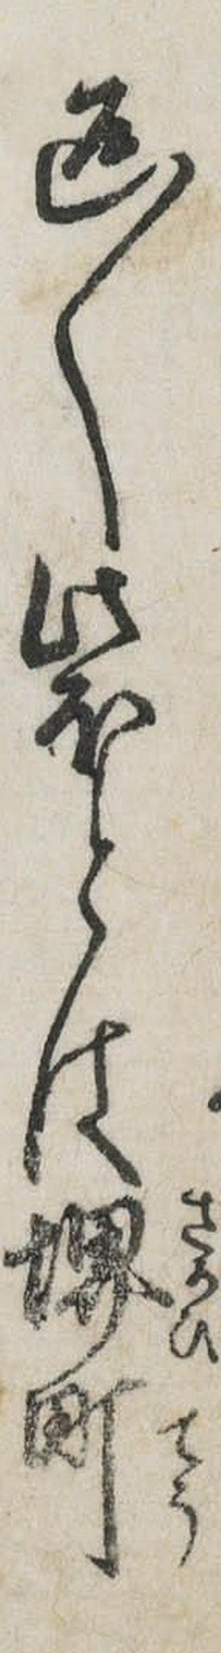返〳〵此ほとは堺町
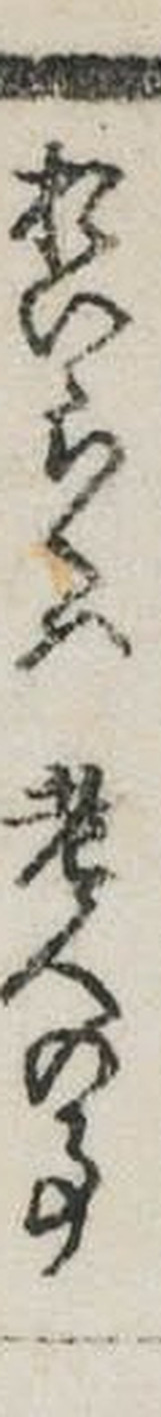おいらくは老人の事
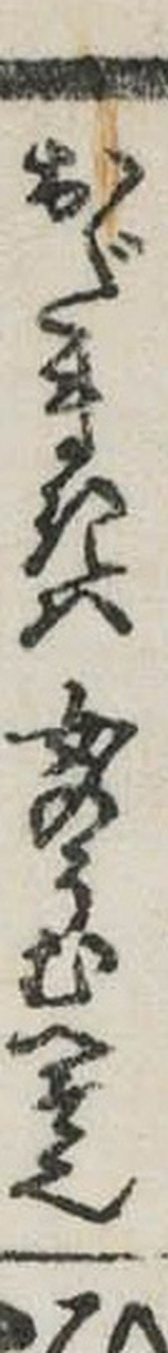おだまきは女のうむへそ也
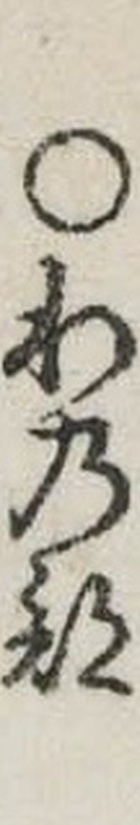○わの部
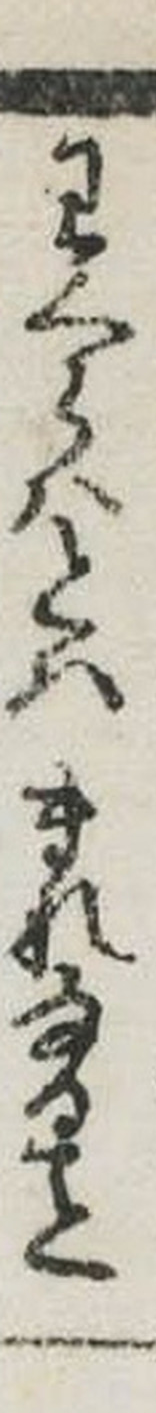わくらはとはまれなること
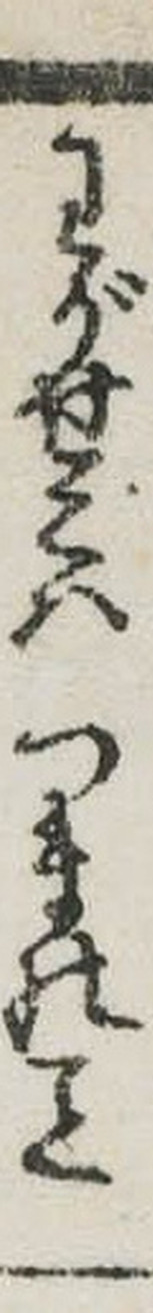わがせとはつまのこと
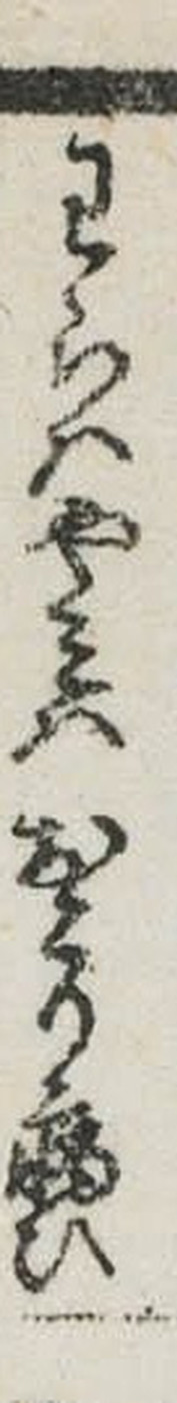わらはやみはおこり病ひ
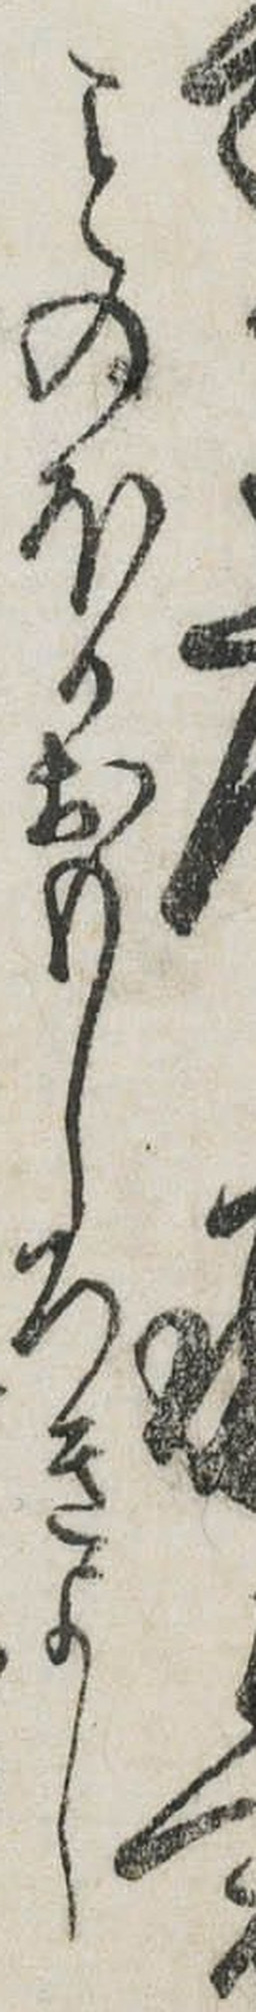ことのほかおもしろきよし
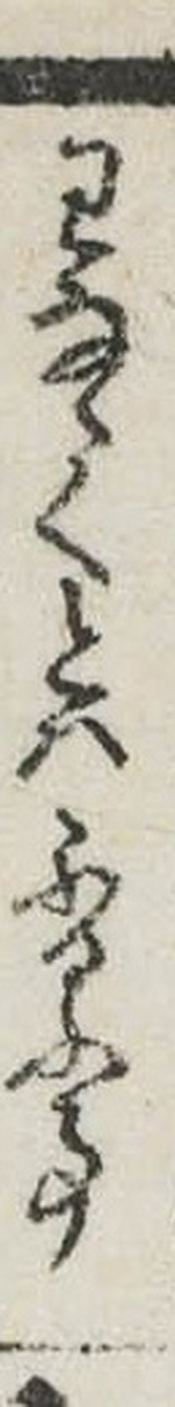わなゝくとはふるふ事
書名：頭書萬用婦人手紙之文言
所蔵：東京学芸大学教育コンテンツアーカイブ
